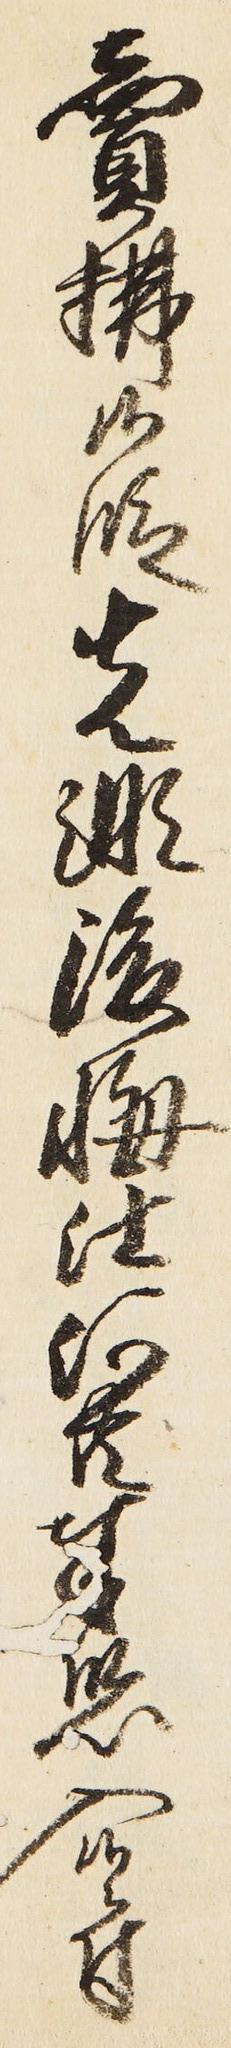売払候段先非後悔仕何共奉恐入候ニ付
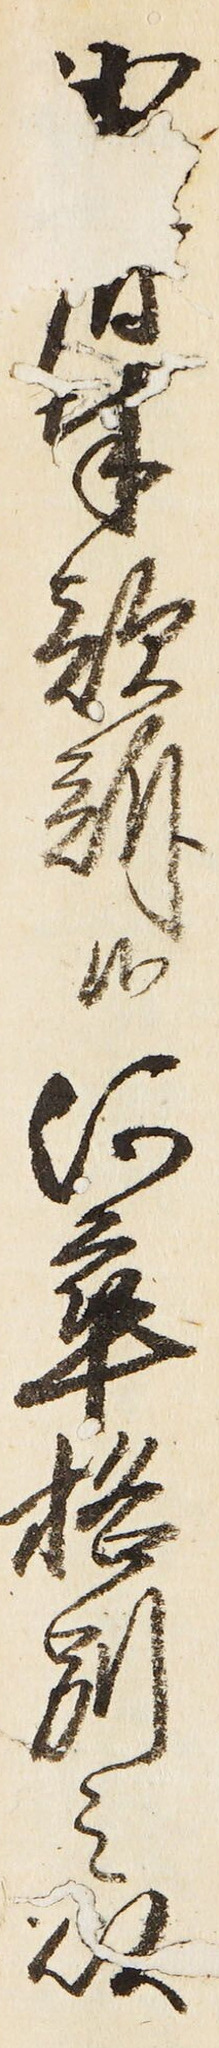出府奉歎訴候何卒格別之以
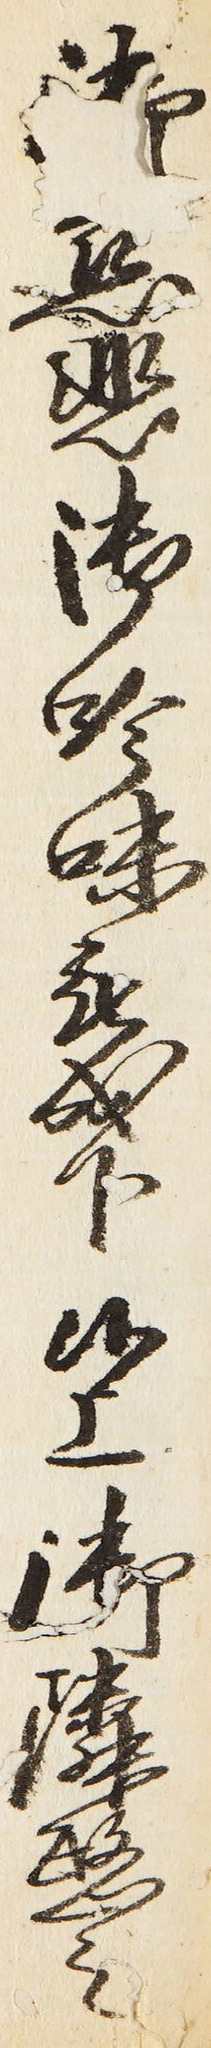御慈悲御吟味被成下候上御隣愍之
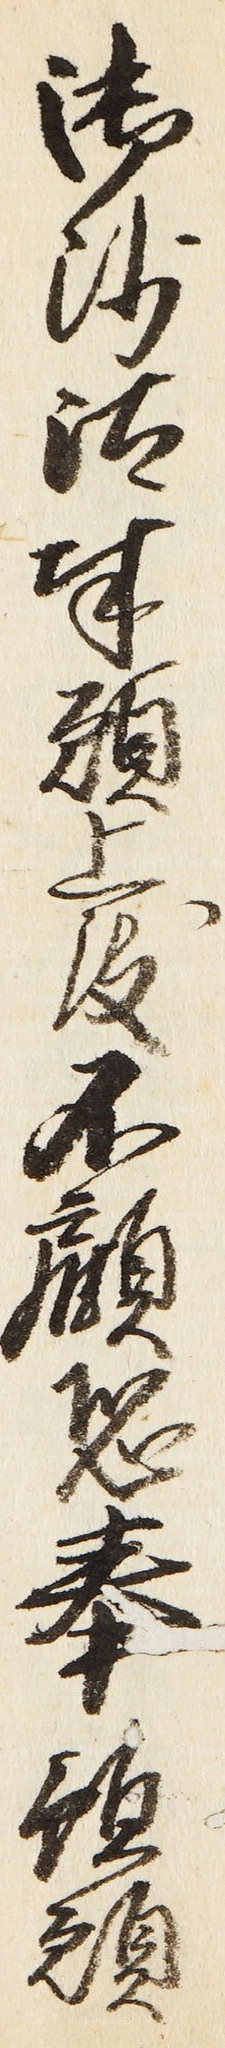御沙汰奉願上度不顧恐奉歎願
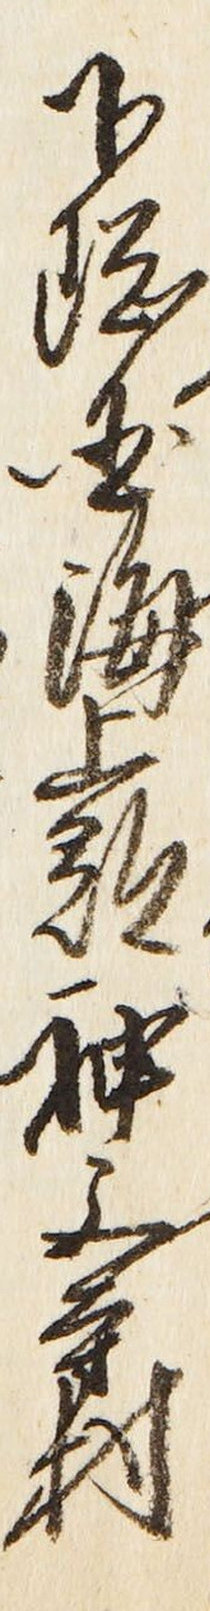下総国海上郡神宮寺村
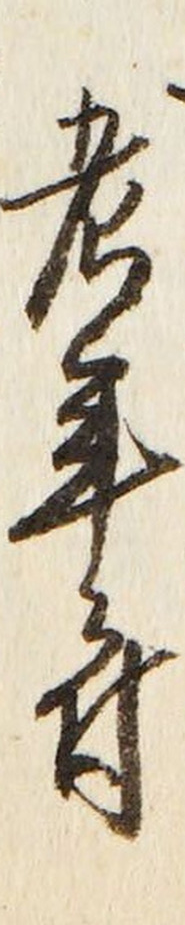老年ニ付
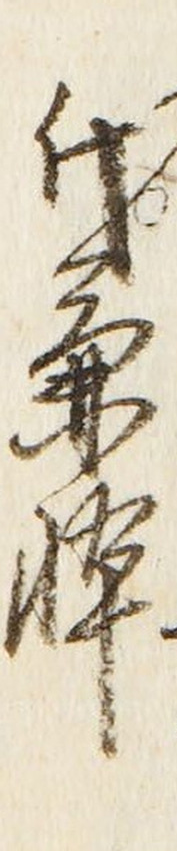代兼忰
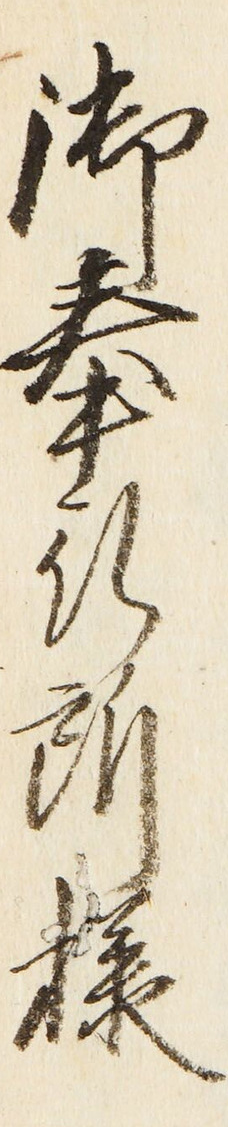御奉行所様

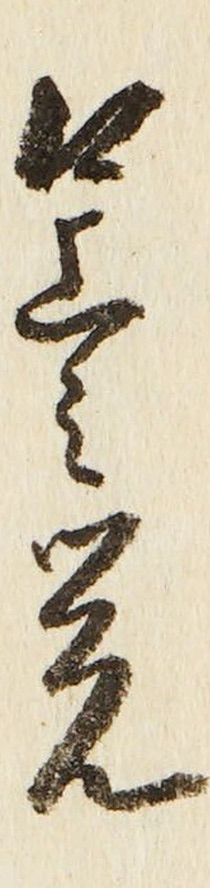口上之覚
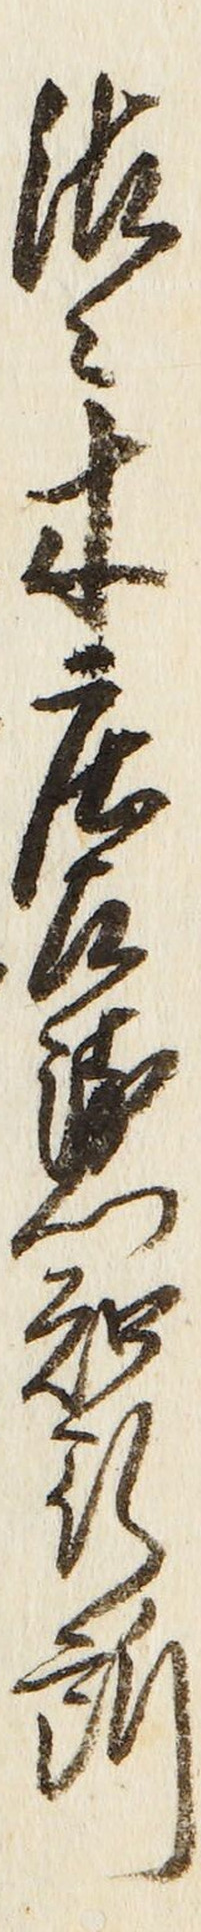佐々木庄左衛門知行所
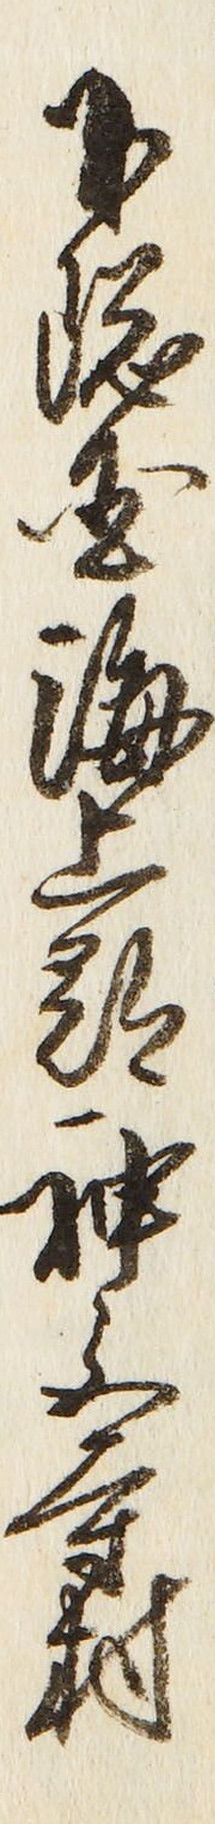下総国海上郡神宮寺村
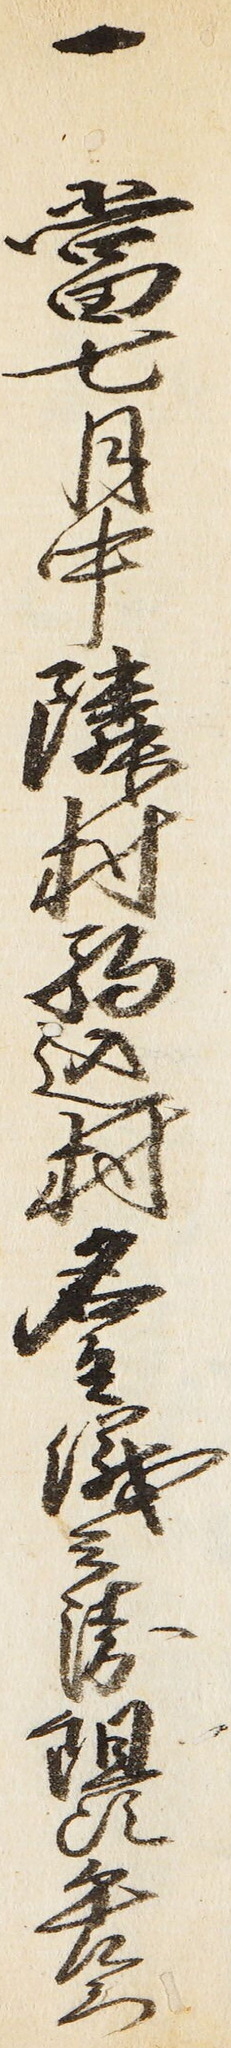一当七月中隣村駒込村名主儀兵衛組頭平左衛門
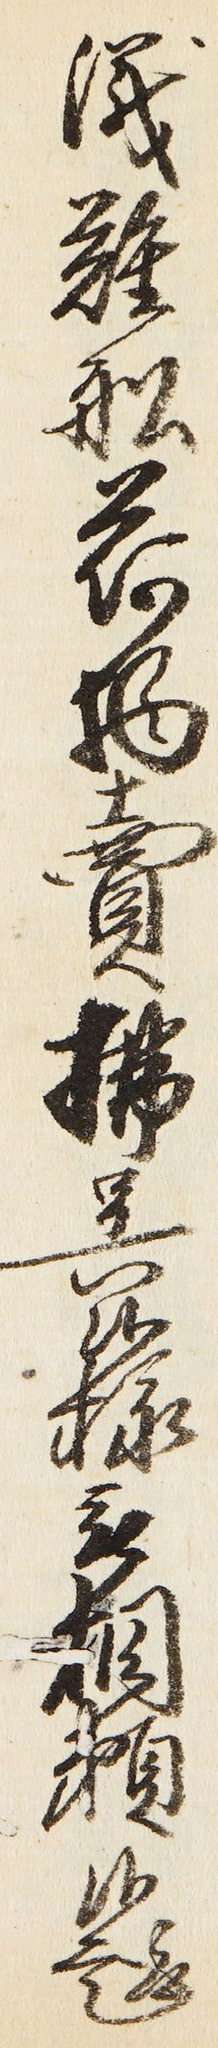儀難船荷物売払呉候様被相頼候趣
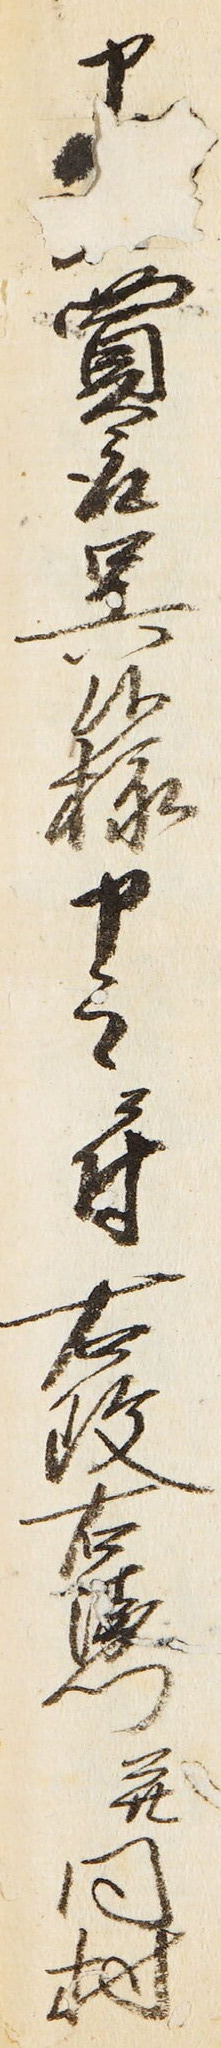申買取呉候様申之ニ付右政右衛門并同村
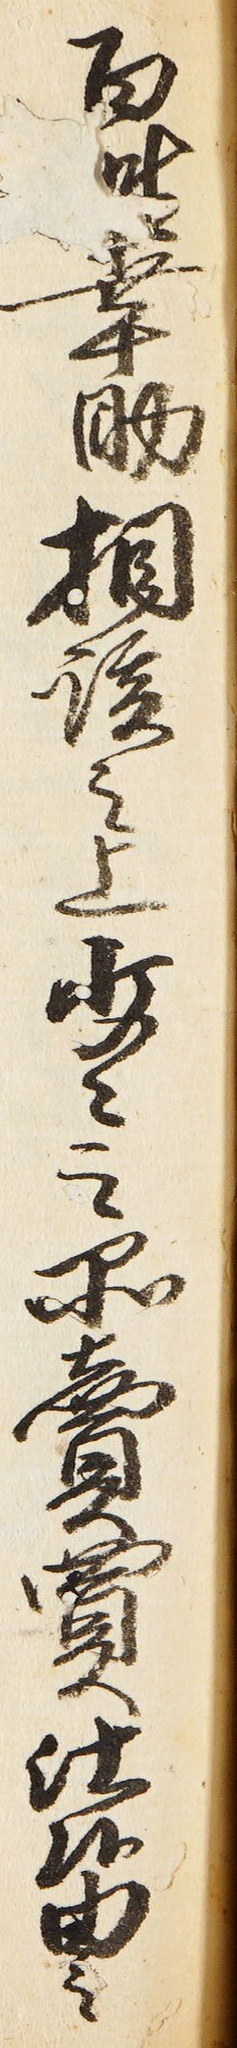百姓幸助相談之上少々之品売買仕候由之
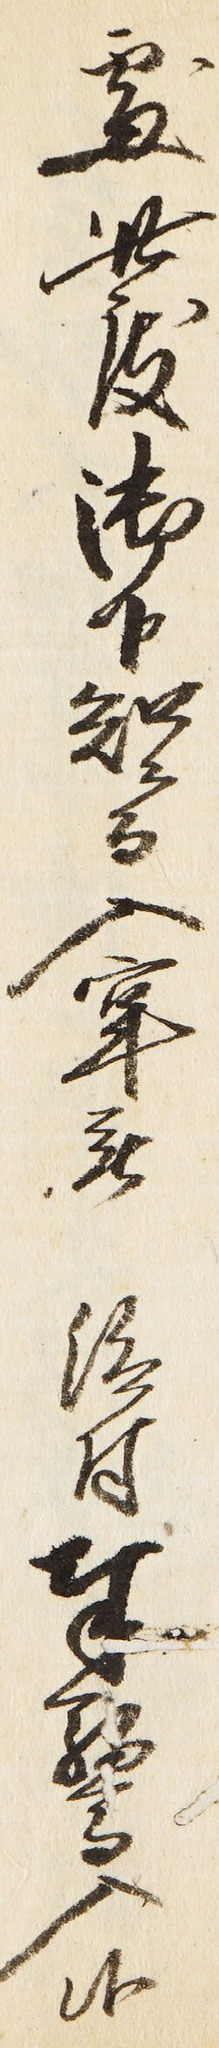処此度御下知ニ而入牢被仰付奉驚入候
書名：難船一件記録
